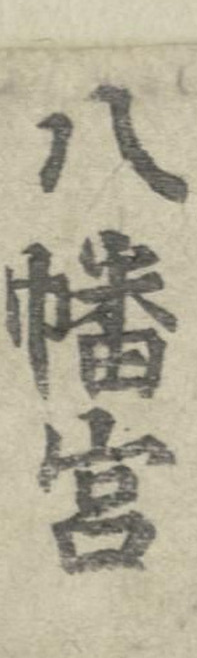八幡宮
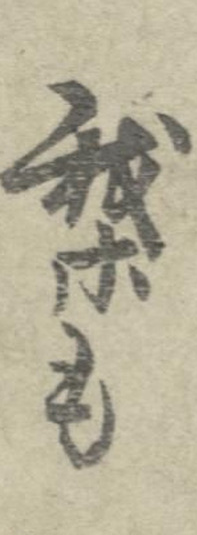我等も
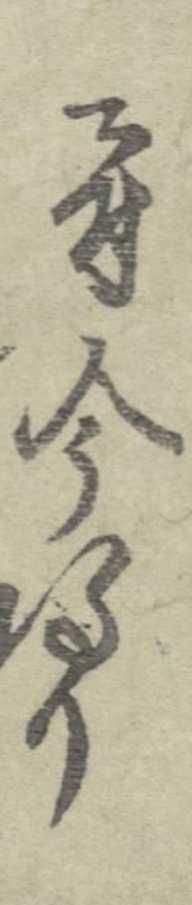ニ付今帰り
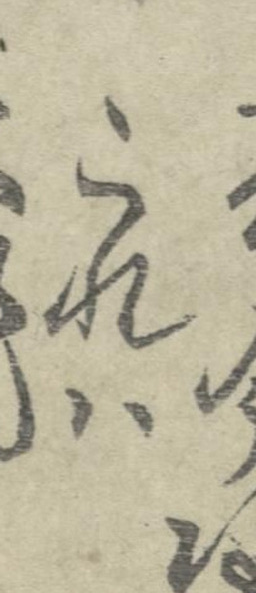これは
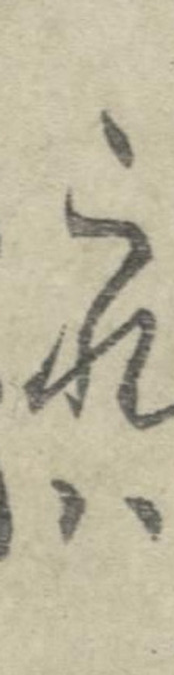これは
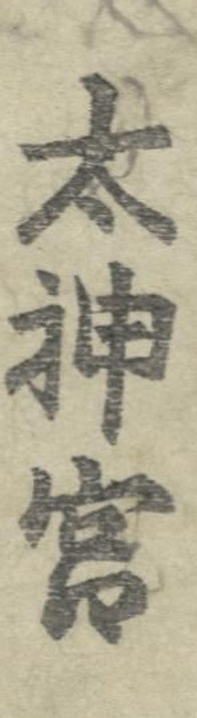太神宮
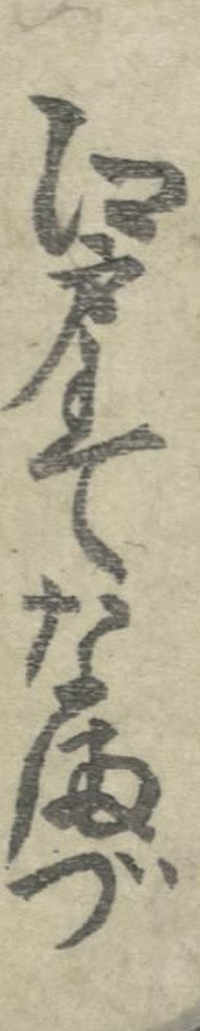江戸にてなまづ
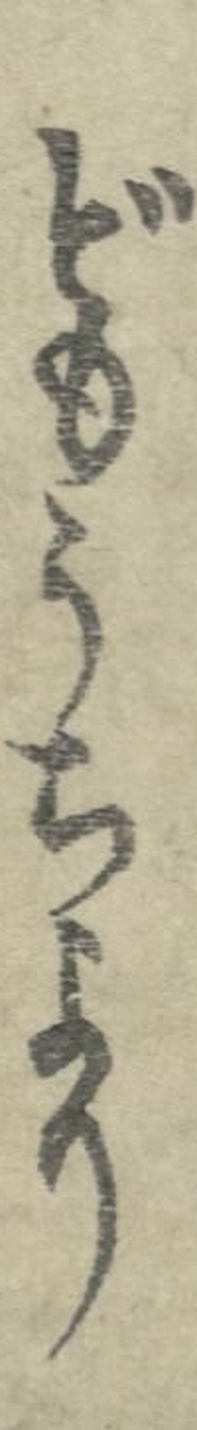どもうちより
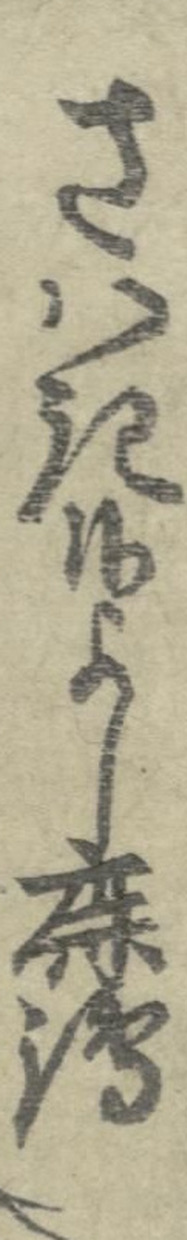さはき候よし鹿嶋
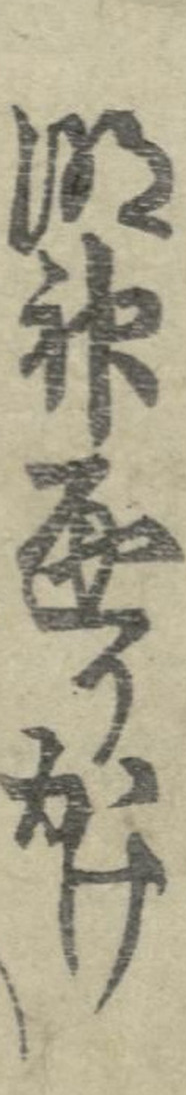明神通りかけ
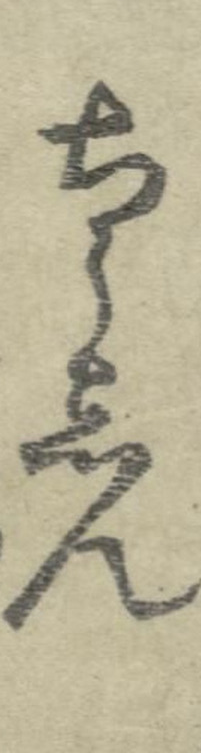ちうしん
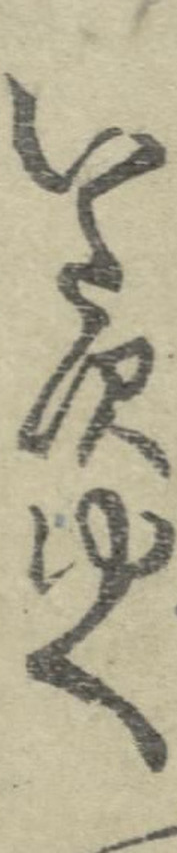いたすゆへ
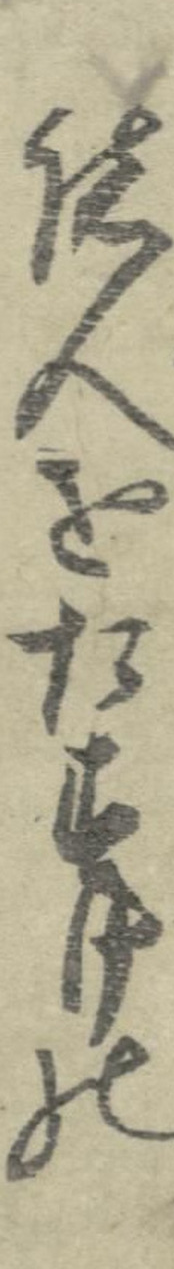諸人をたすけの
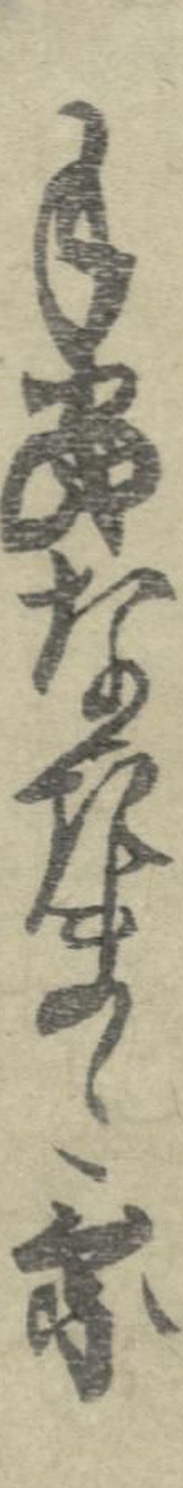手当なきまゝ我
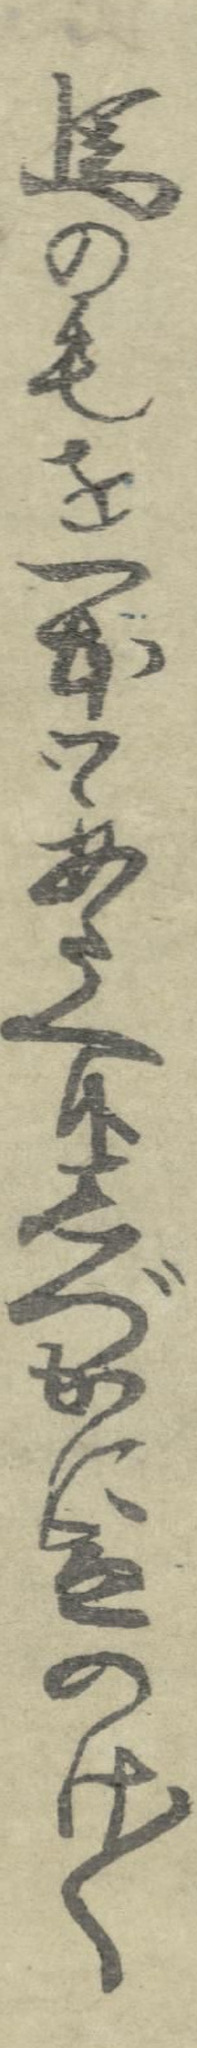馬の毛を一本ツヽあたへ候しづかに立のけ〳〵
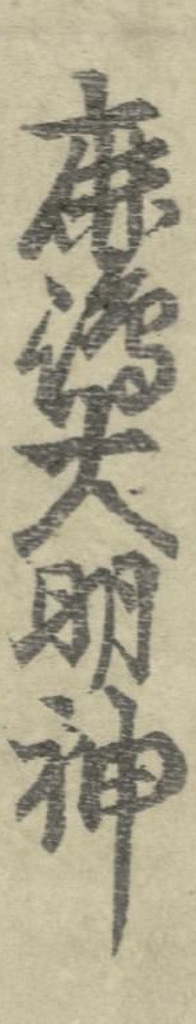鹿嶋大明神
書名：[八幡宮・太神宮・鹿島大明神]
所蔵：東京大学地震研究所図書室 Earthquake Research Institute Library, The University of Tokyo, JAPAN
